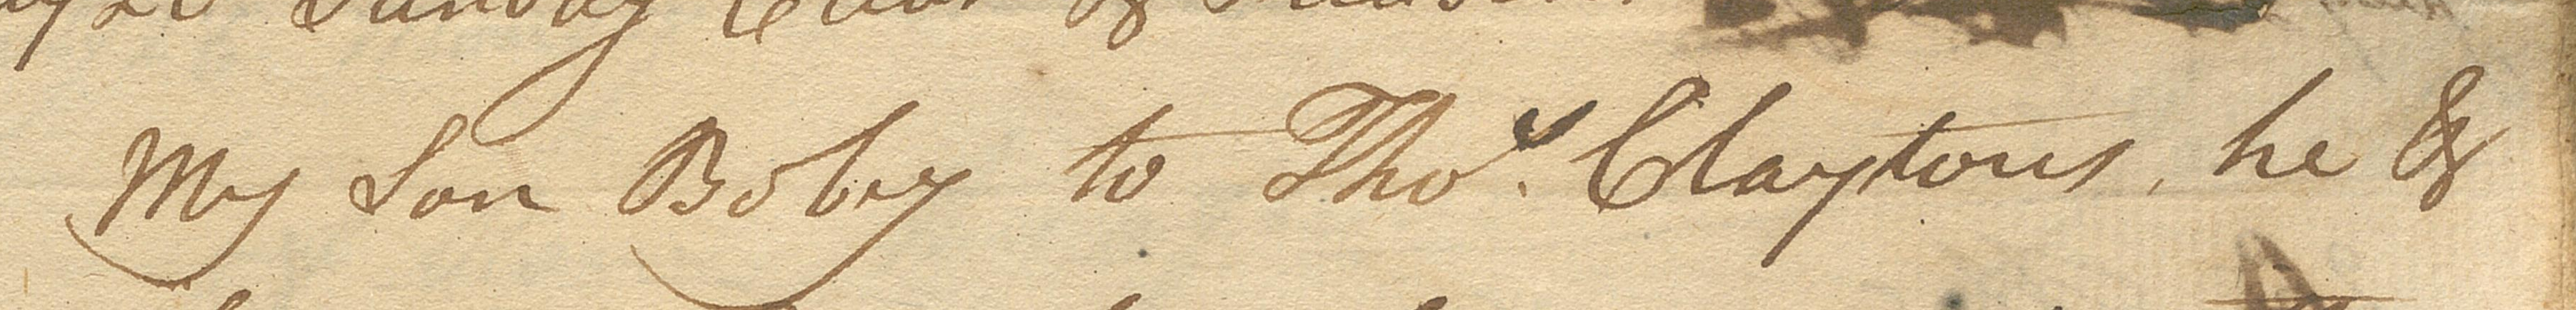My Son Bobey to Tho^s. Claytons, he &
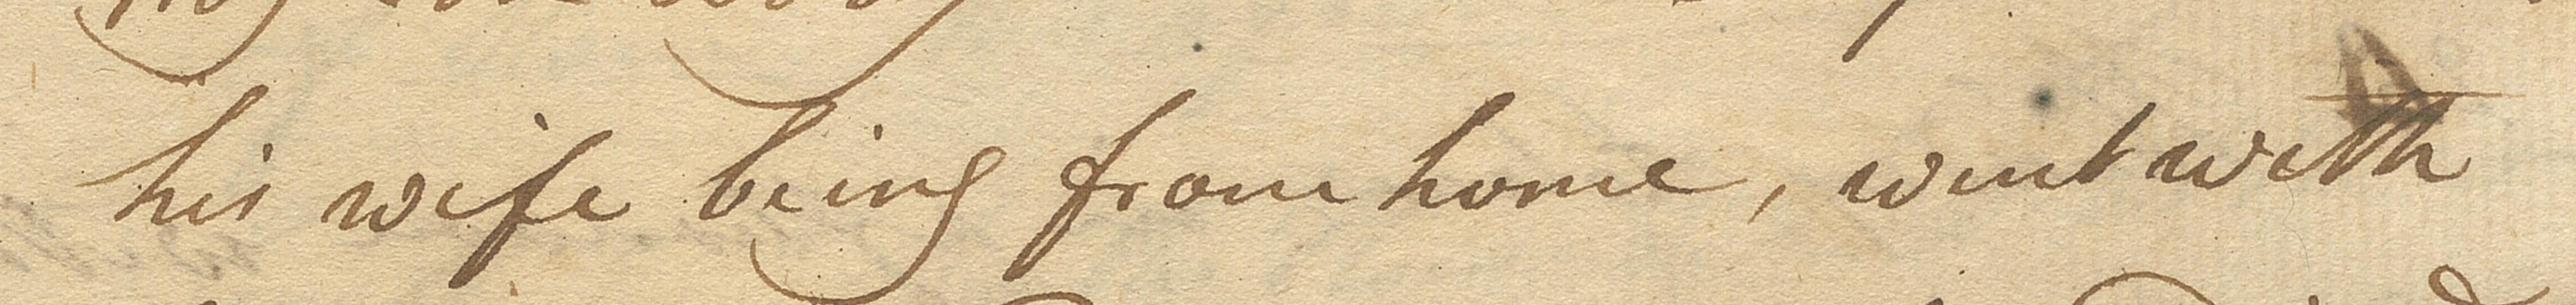his wife being from home, went with
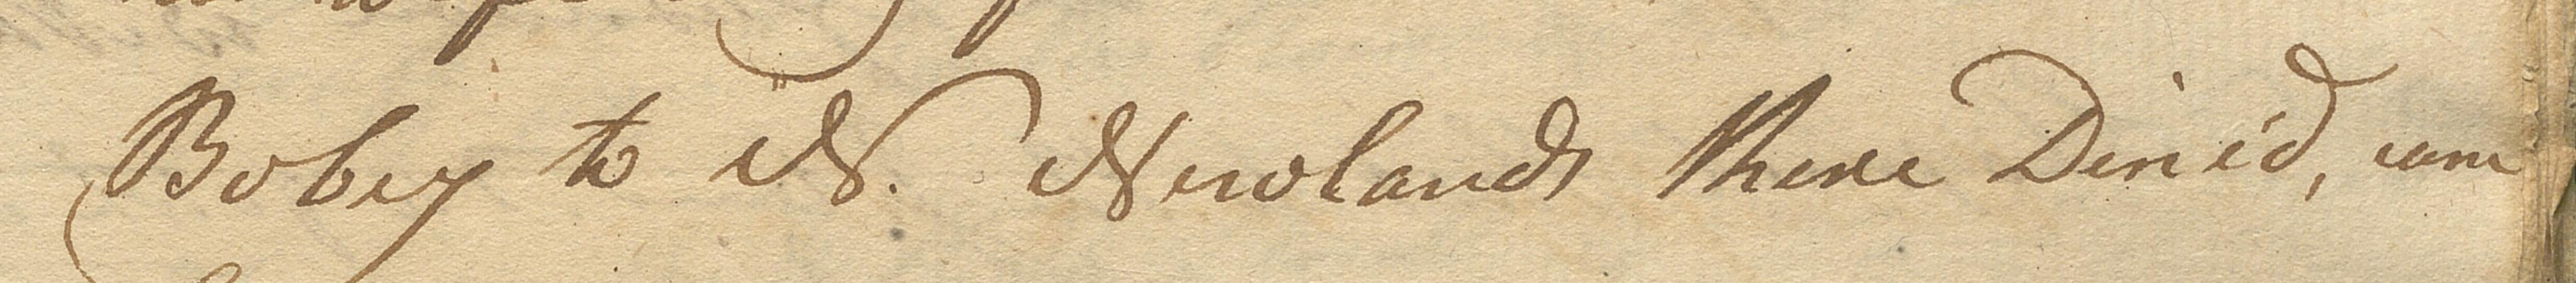Bobey to N. Newlands there Dine'd, cam
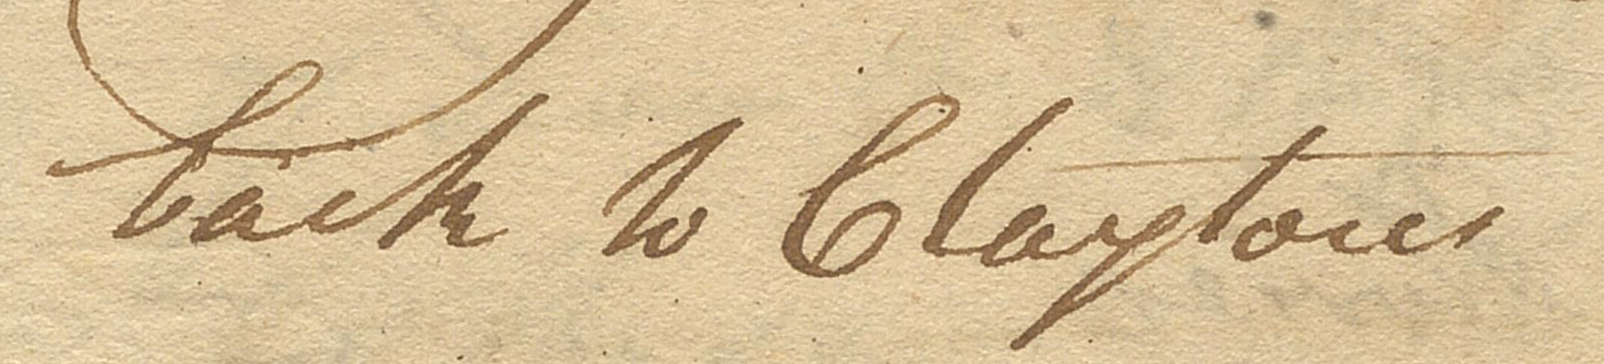back to Claytons
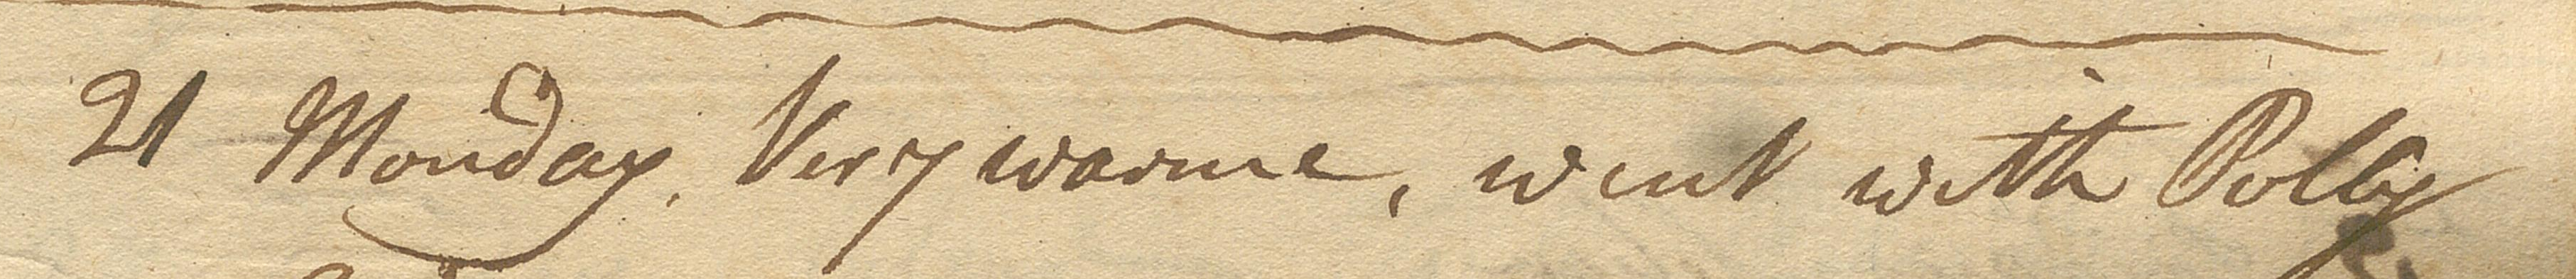21 Monday, Very warme, went with Polly
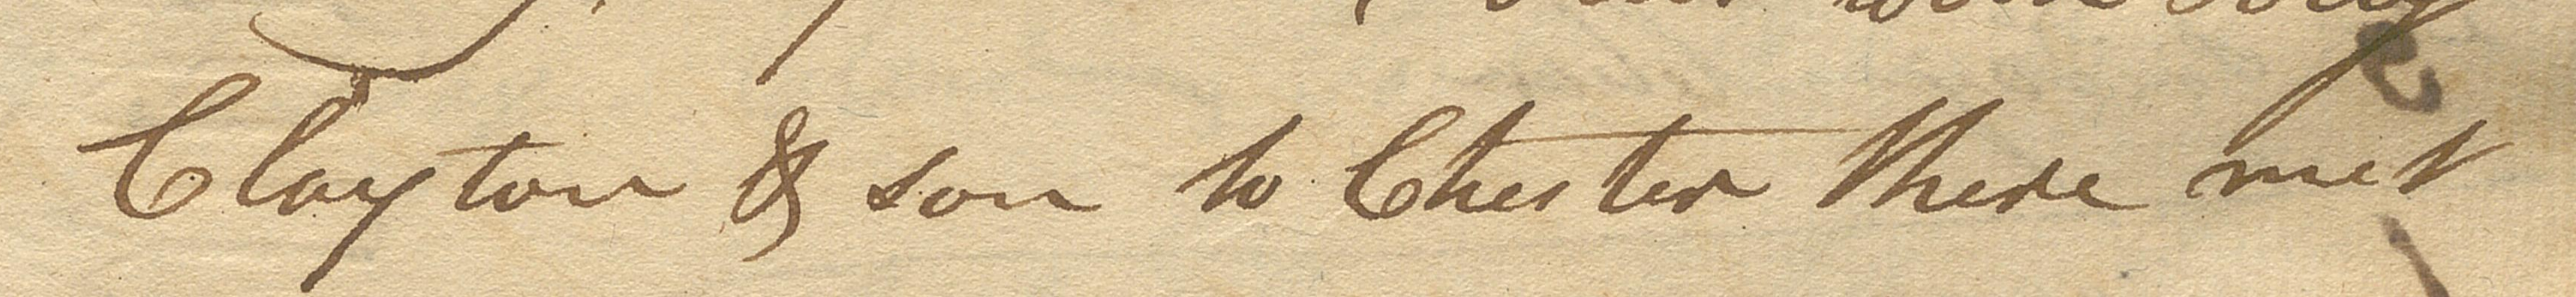Clayton & son to Chester these met
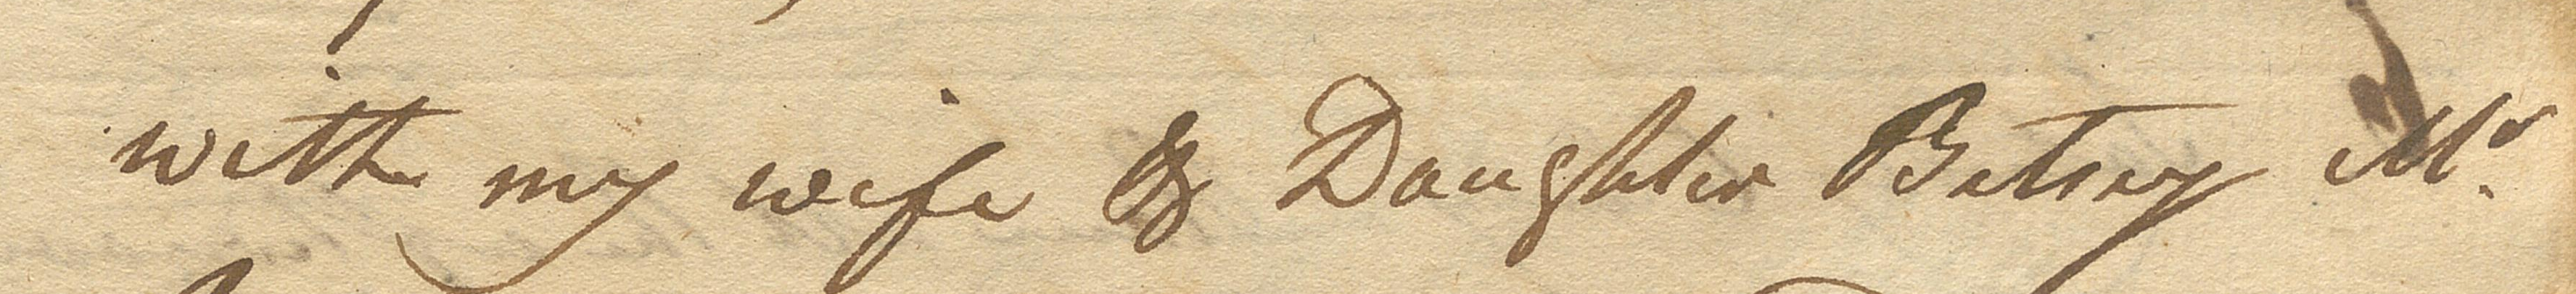with my wife & Daughter Betsey M^r.
